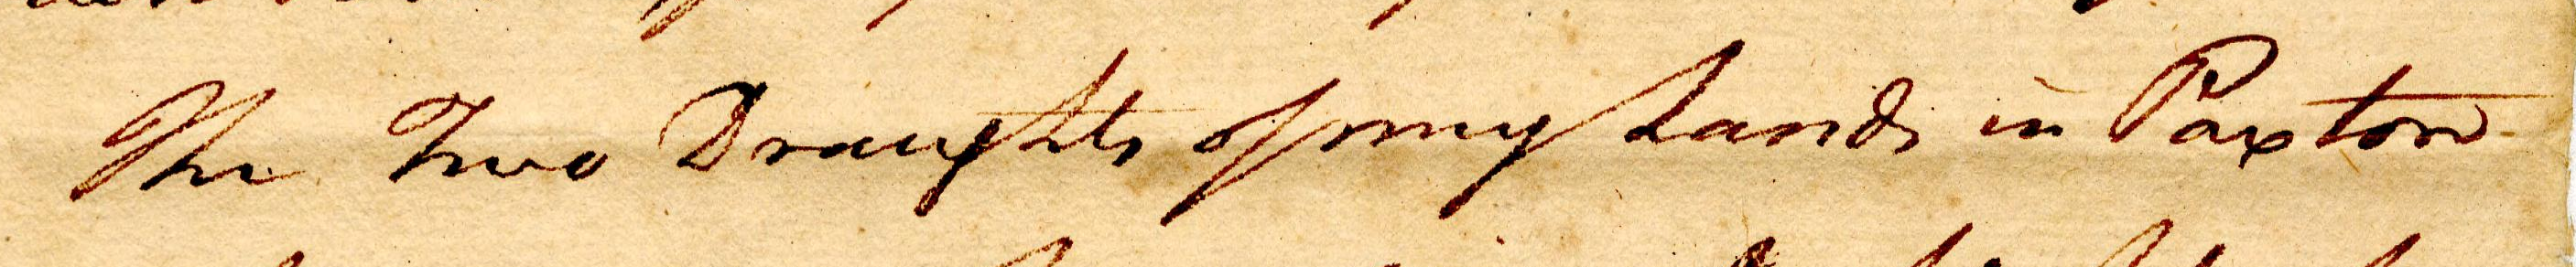The Two Draughts of my Lands in Paxton
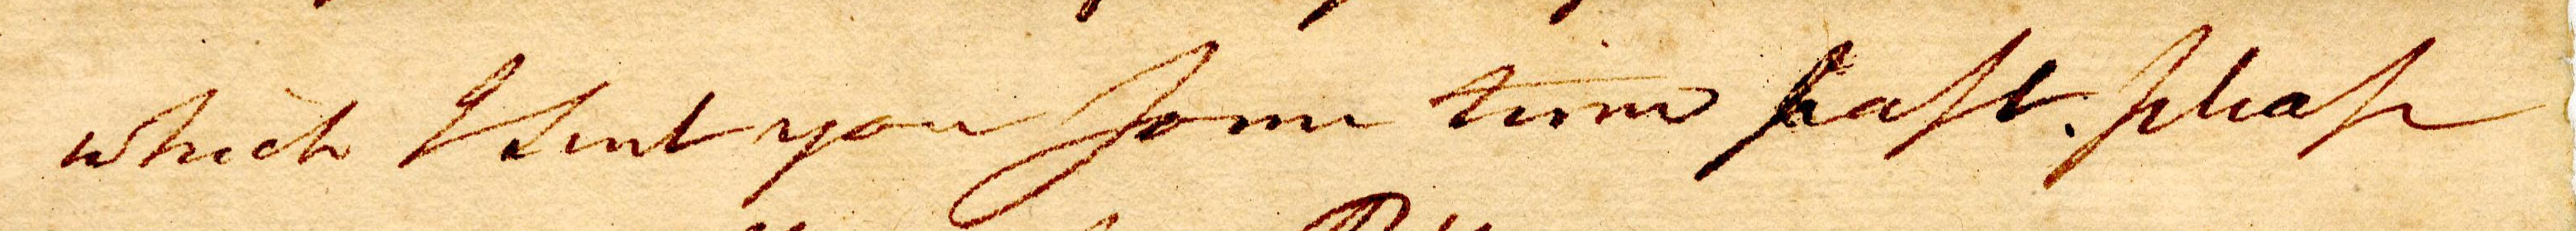which I sent you some time past, please
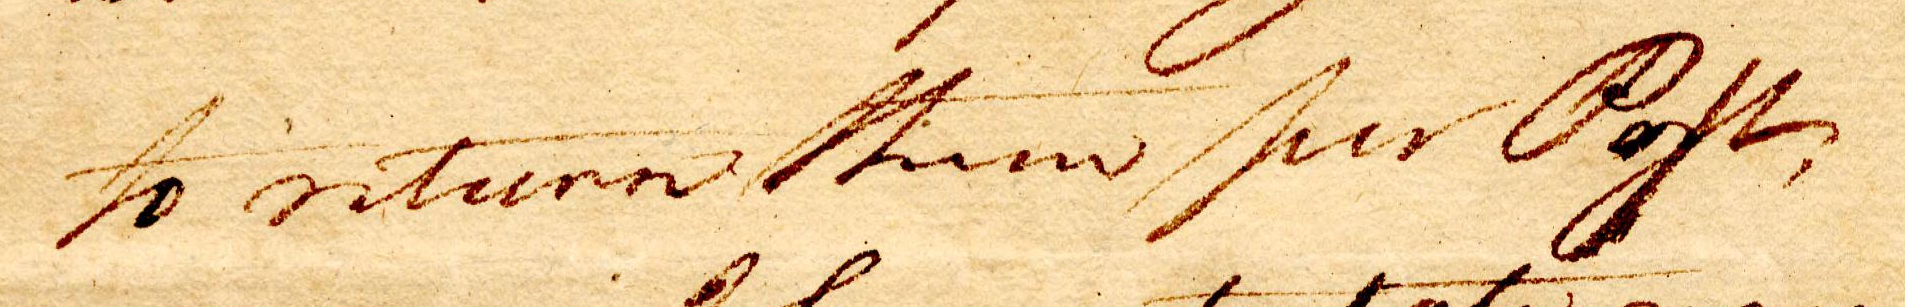to return them per Post,
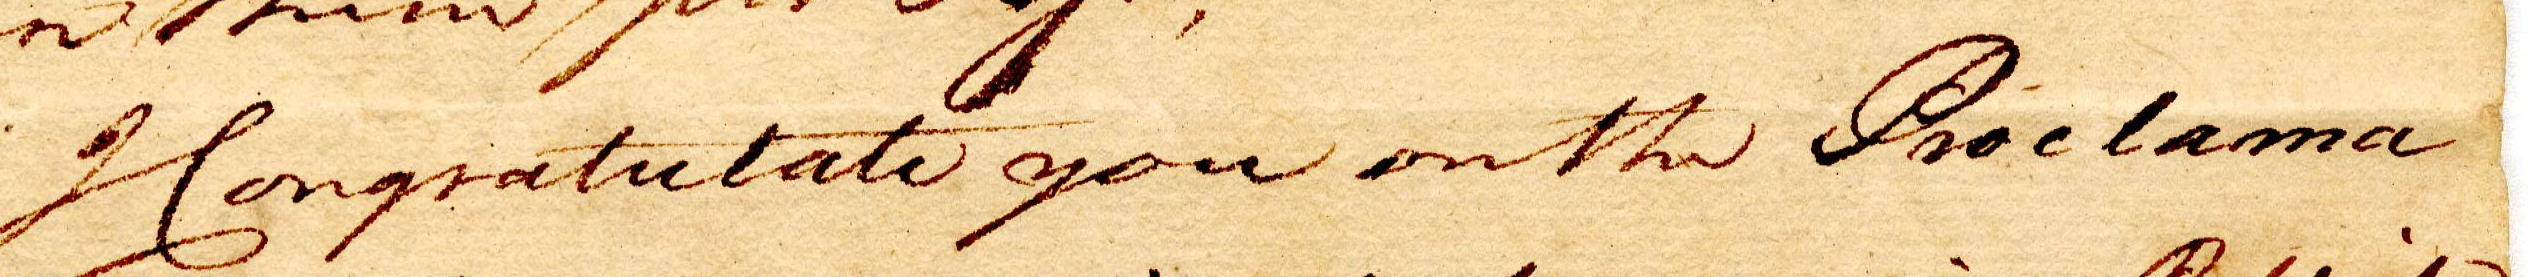I Congratulate you on the Proclama-
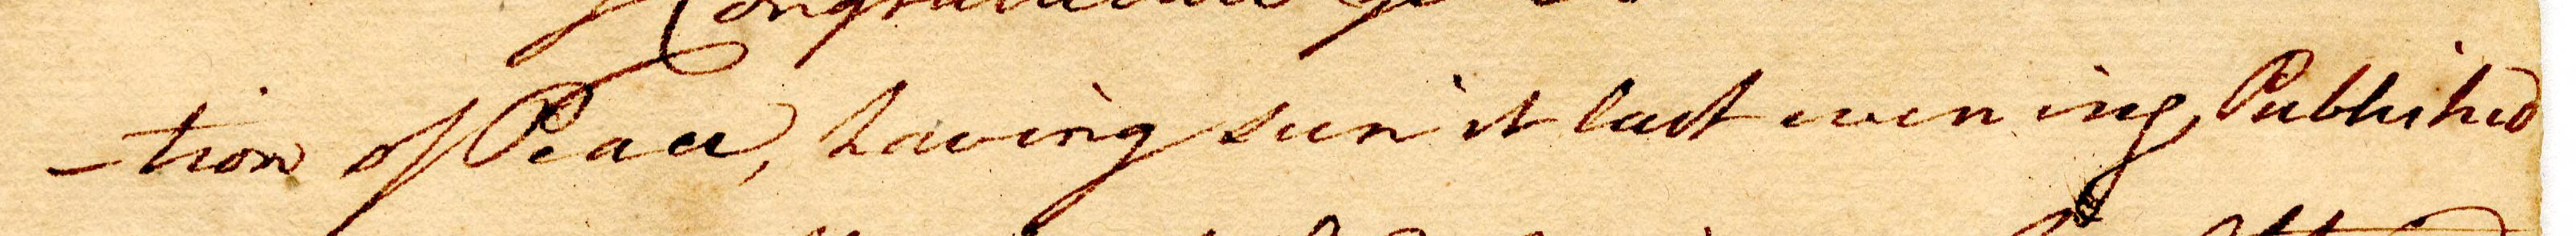-tion of Peace, having seen it last evening, Published
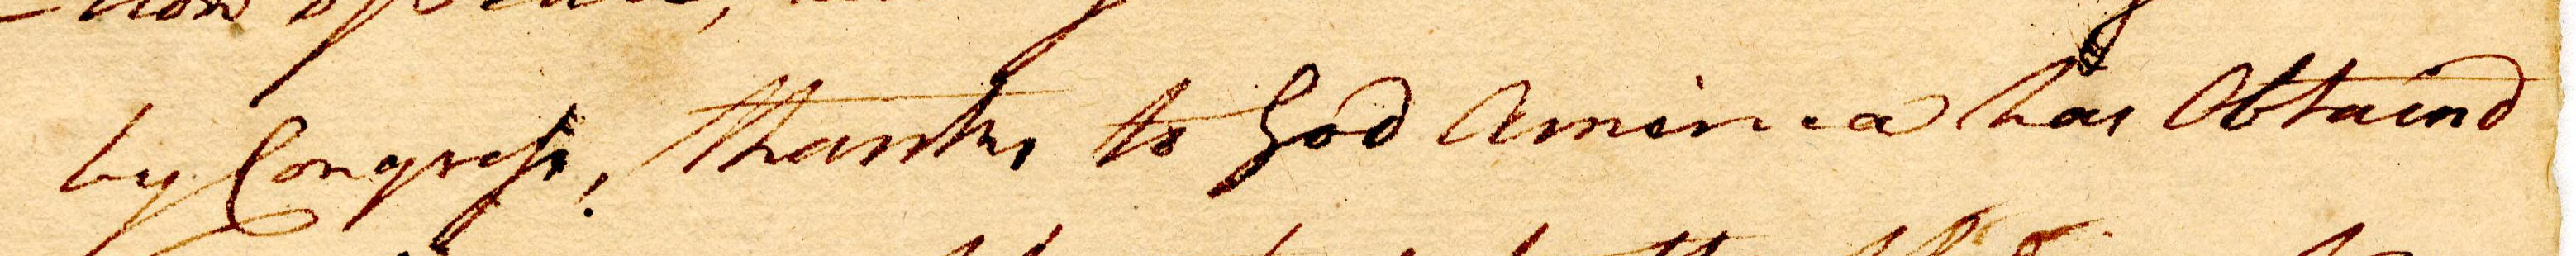by Congress, thanks to God America has Obtaind
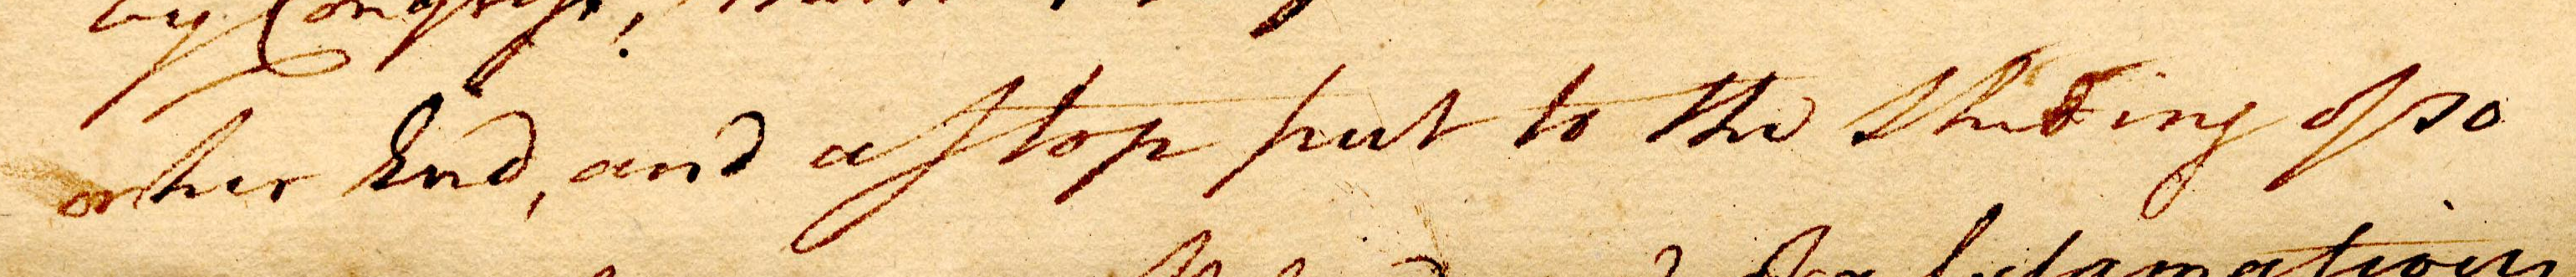[a] her End, and a stop put to the sheding of so
